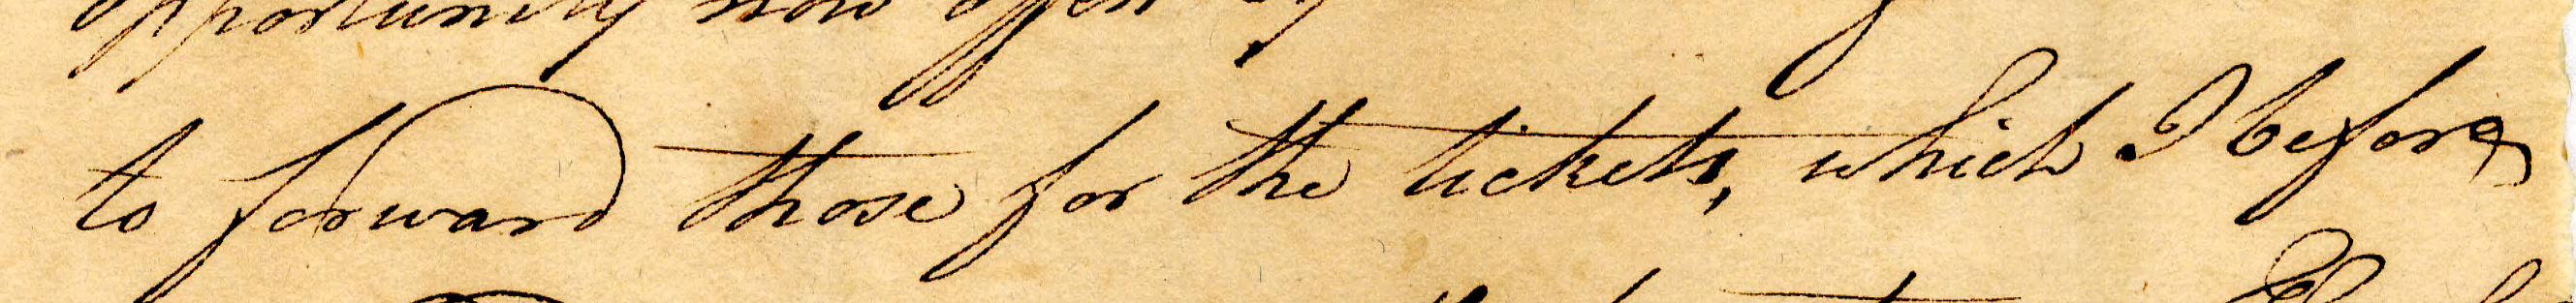to forward those for the tickets which I before
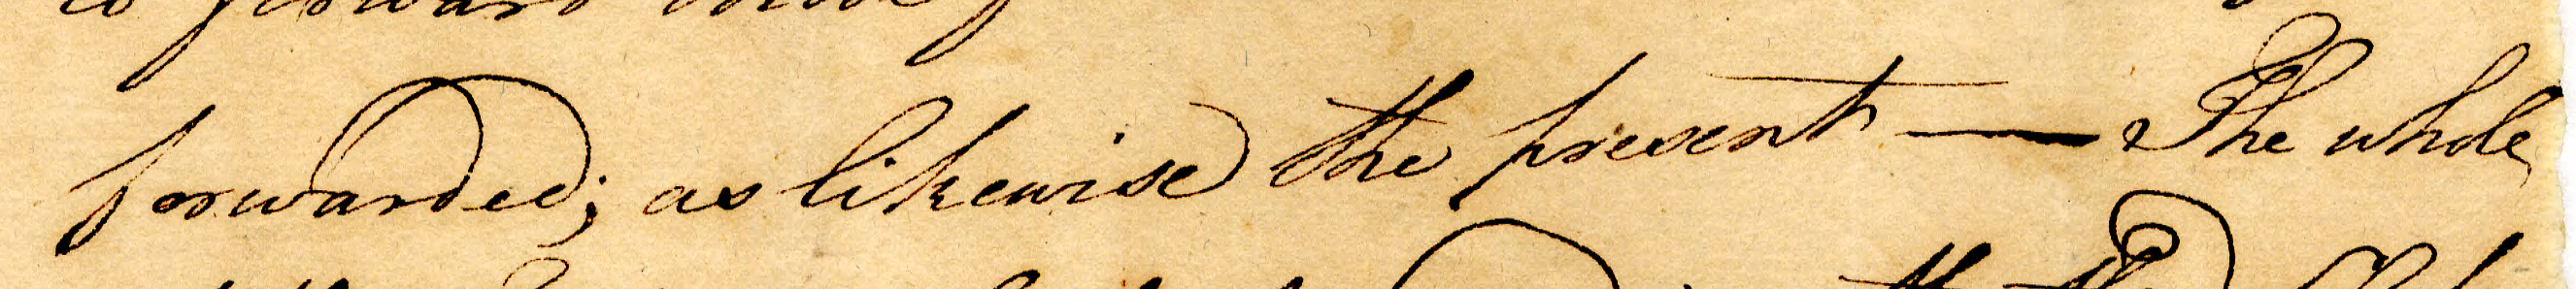forwarded as likewise the present- The whole
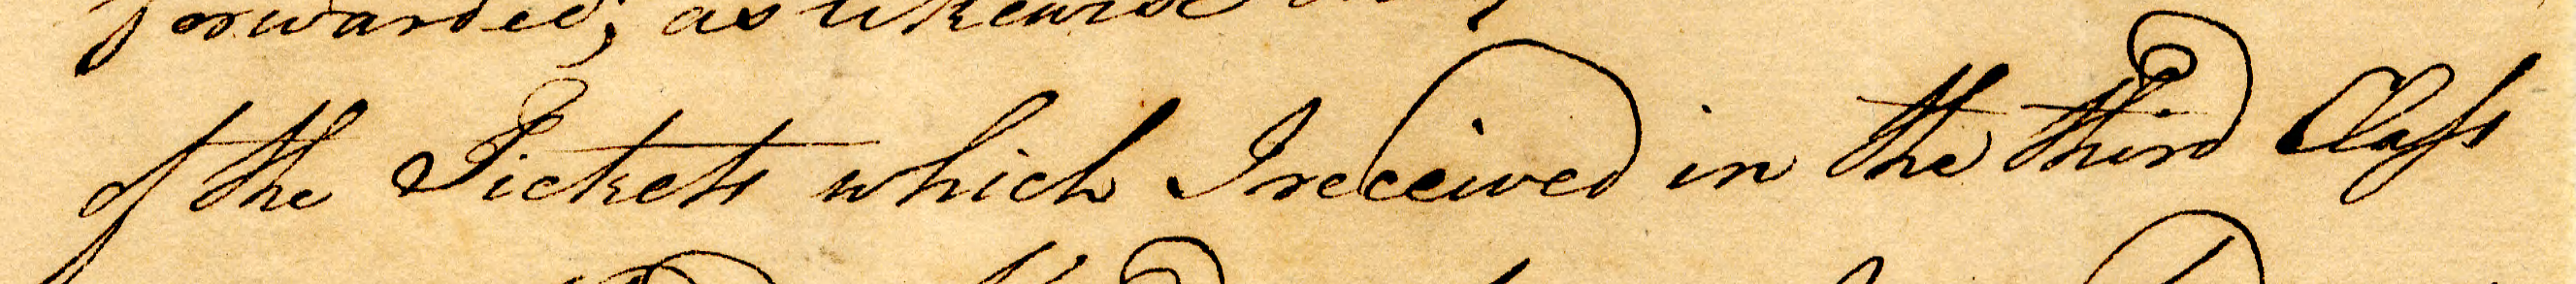of the Tickets which I received in the third Class
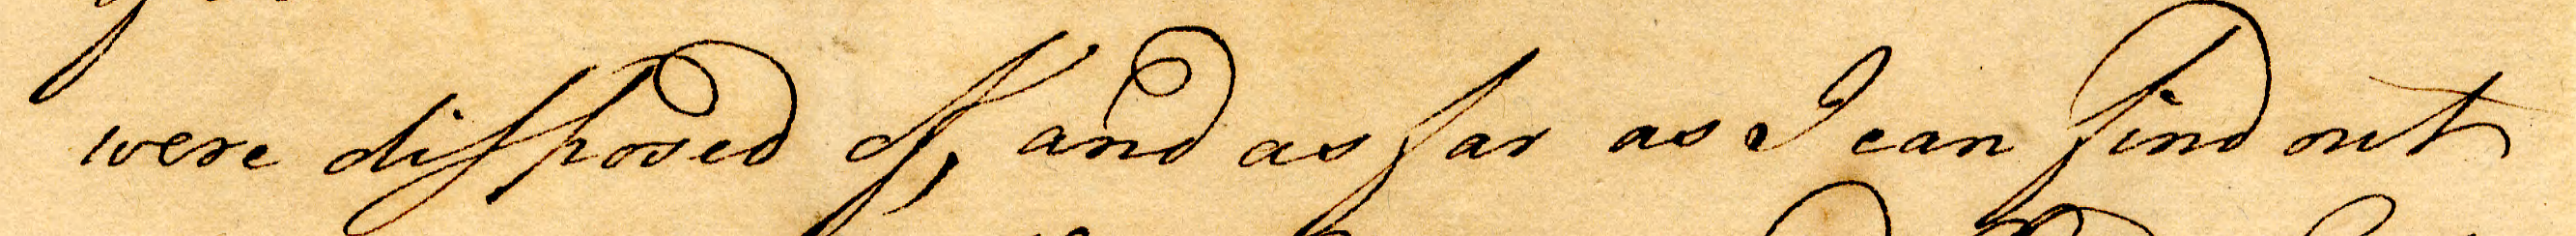were disposed of, and as far as I can find out
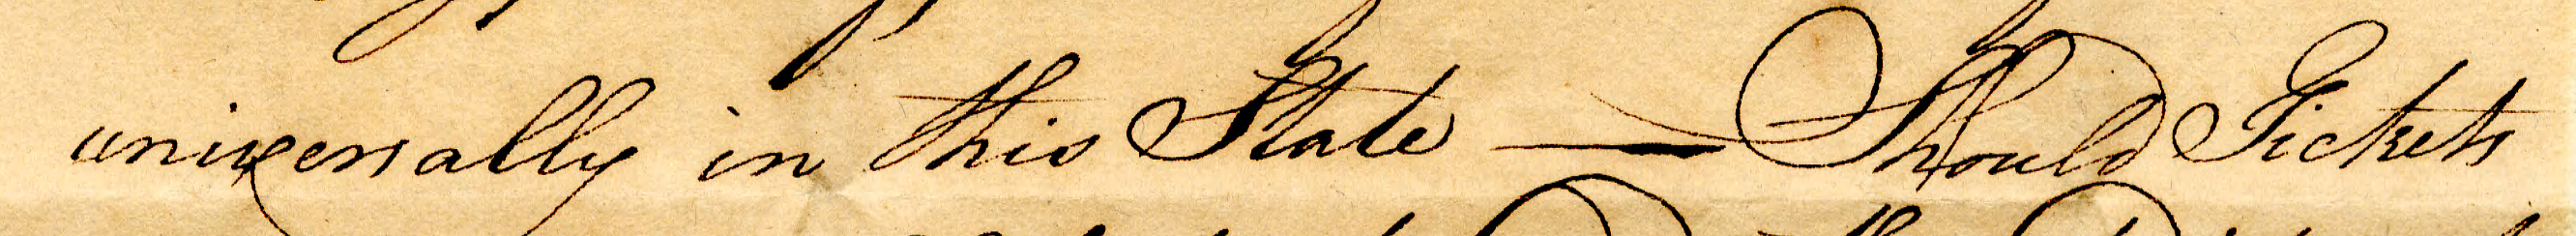universally in this State- Should Tickets
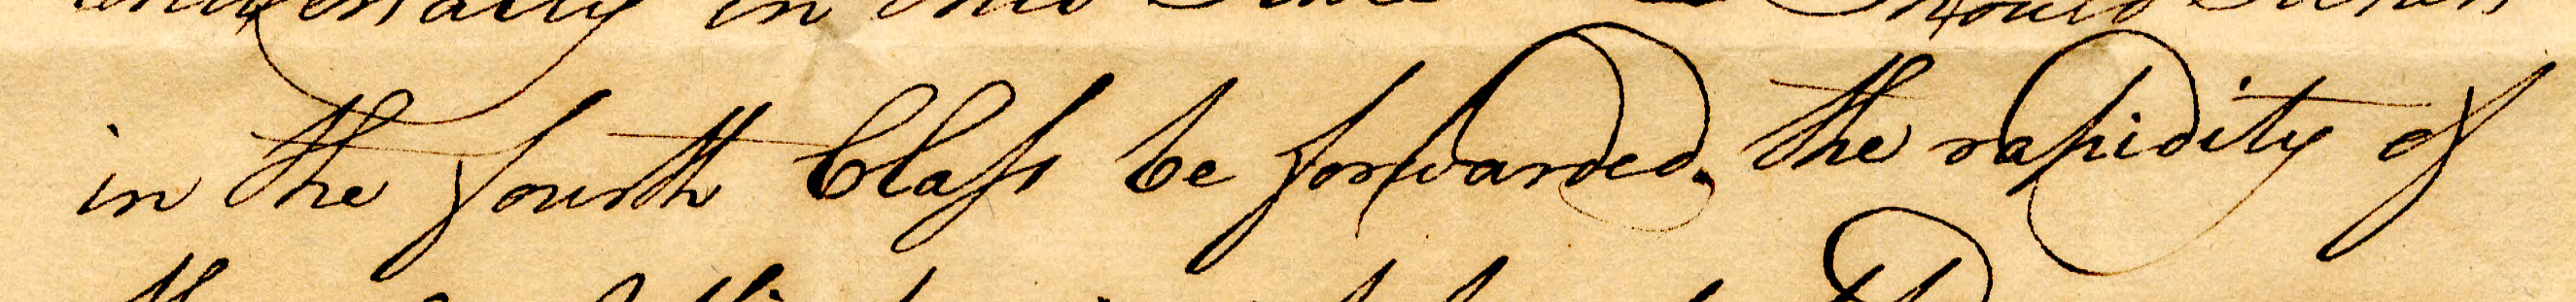in the fourth Class be forwarded, the validity of
